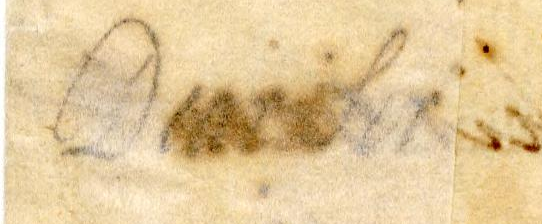Dear Sir
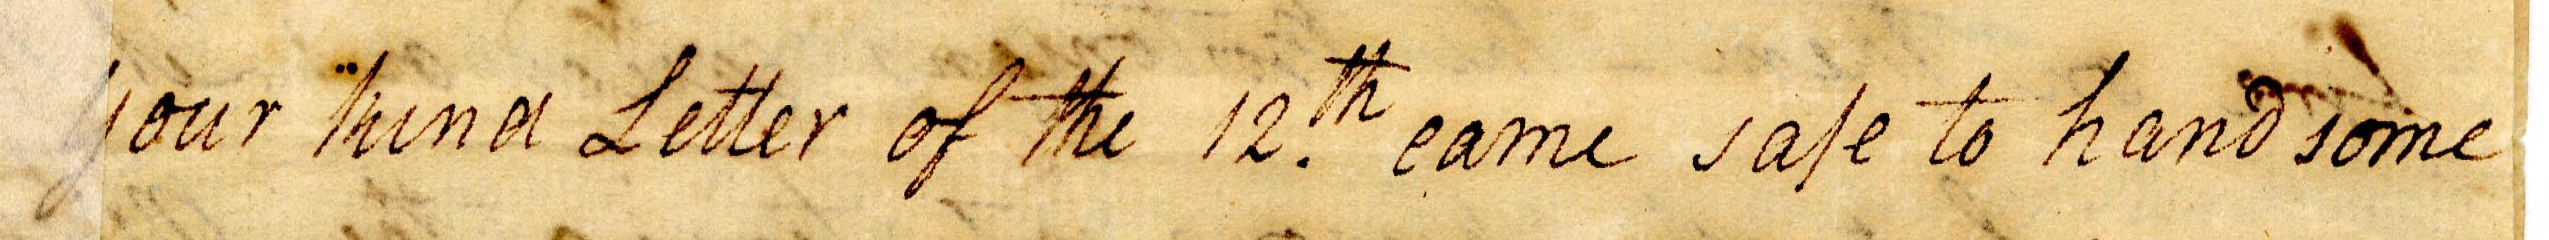Your kind Letter of the 12^th. came safe to hand some
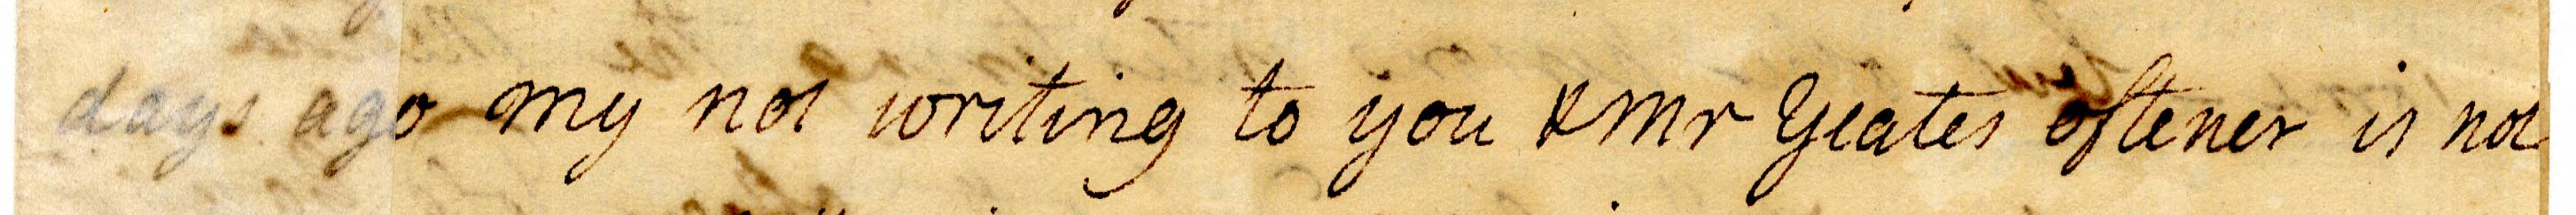days ago my not writing to you & Mr Yeates oftener is not
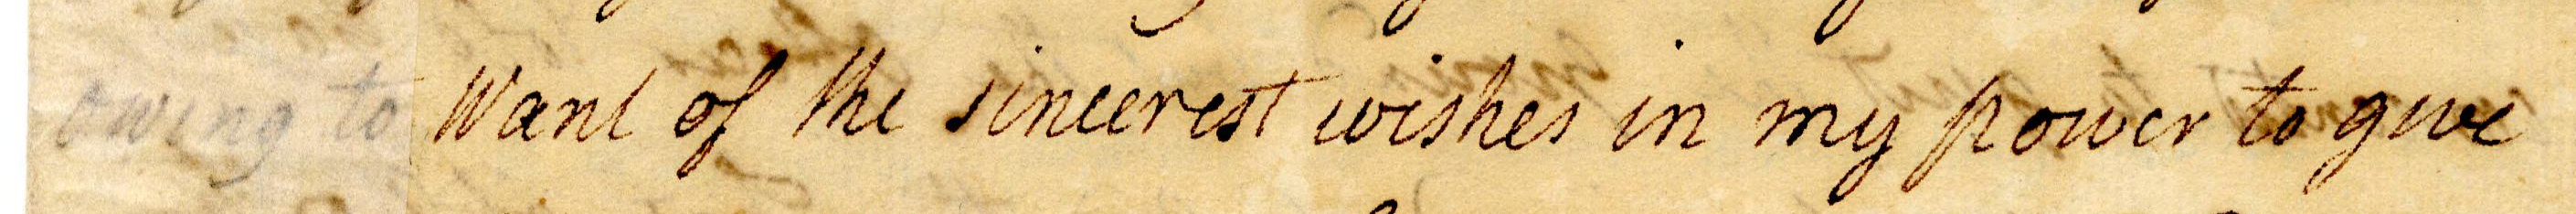owing to Want of the sincerest wishes in my power to give
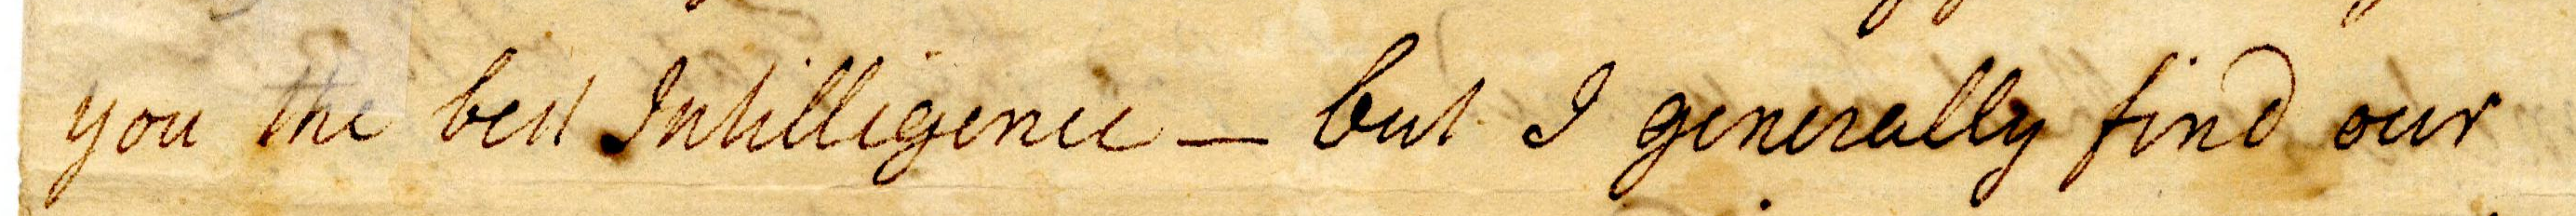you the best Intilligence- but I generally find our
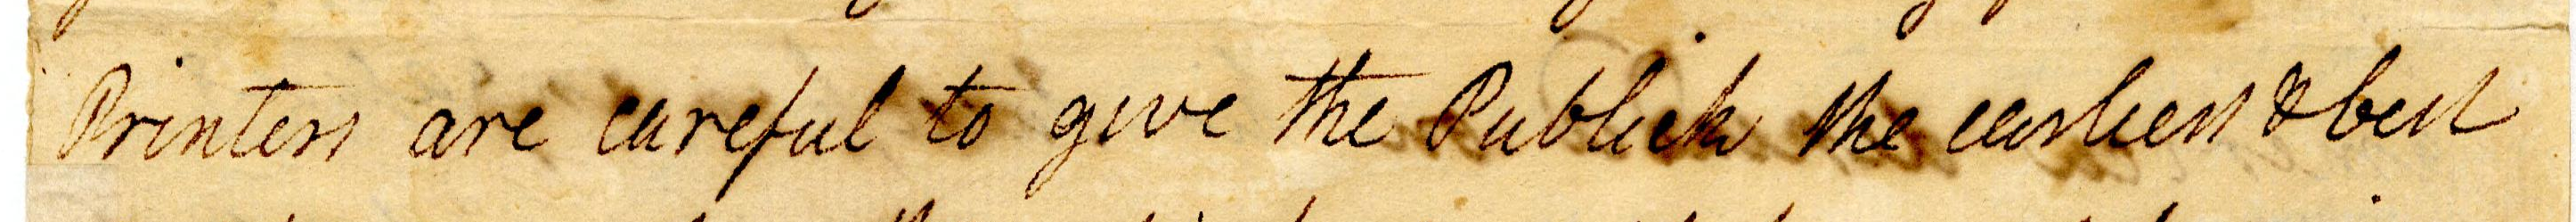Printers are careful to give the Publick the earliest & best
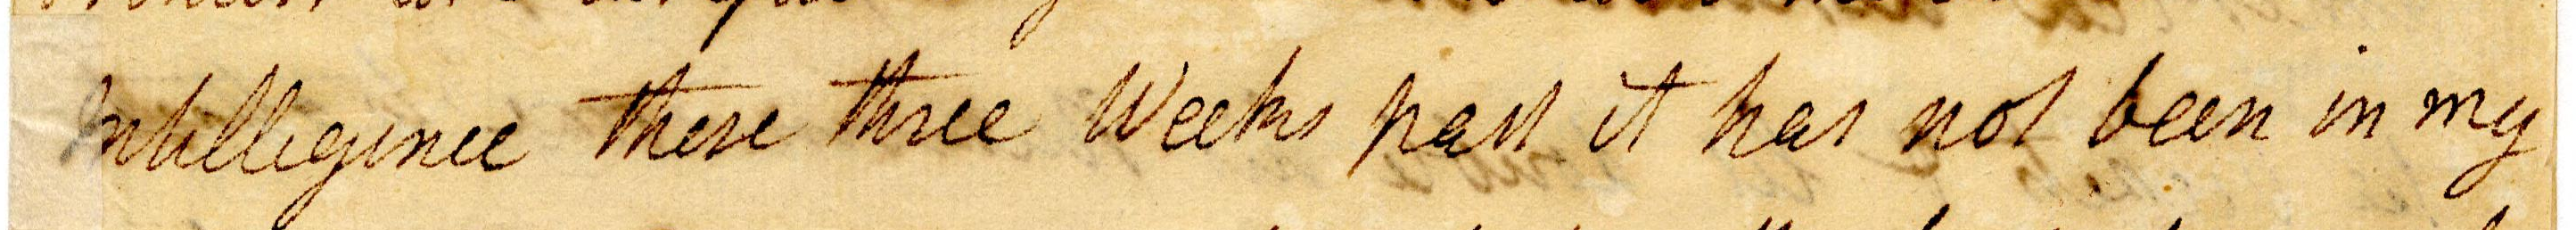Intilligence these three Weeks past it has not been in my
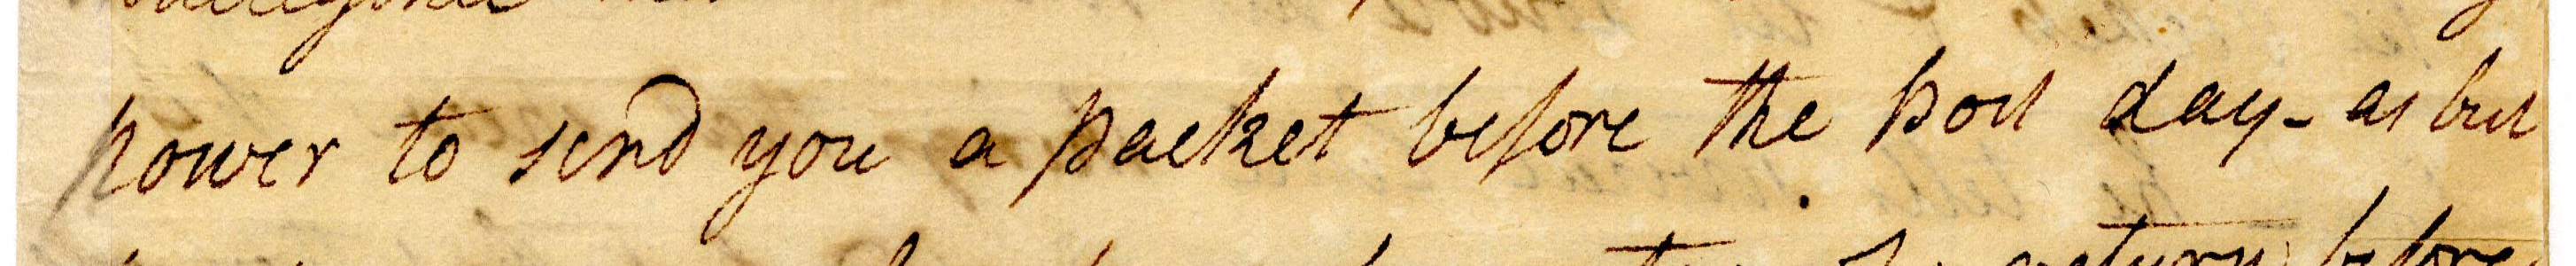power to send you a packet before the post day- as but
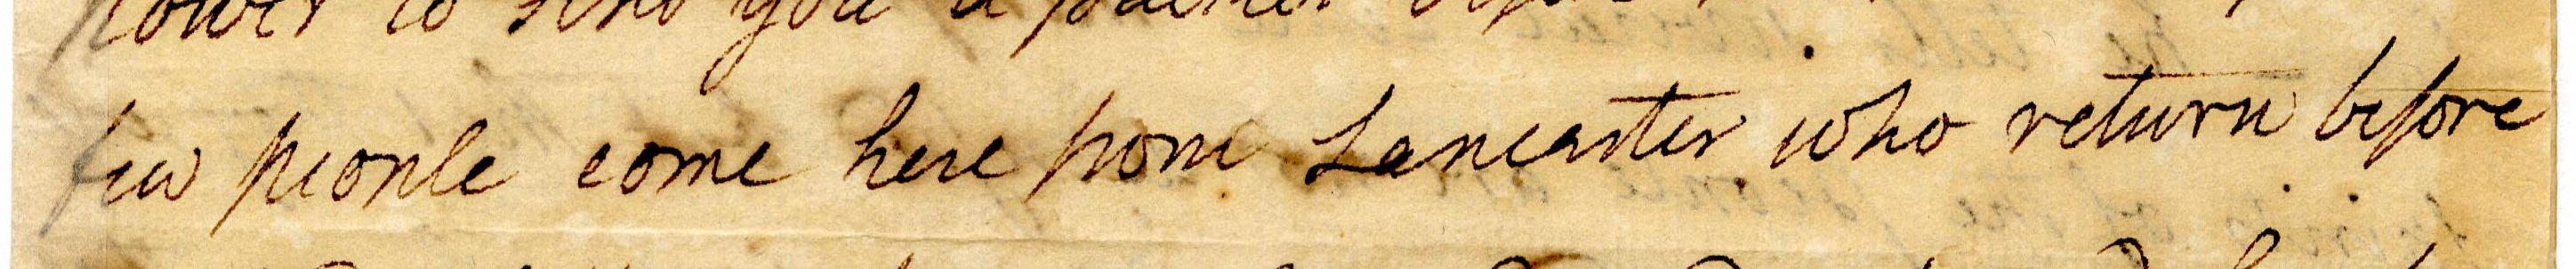few people come here from Lancaster who return before
